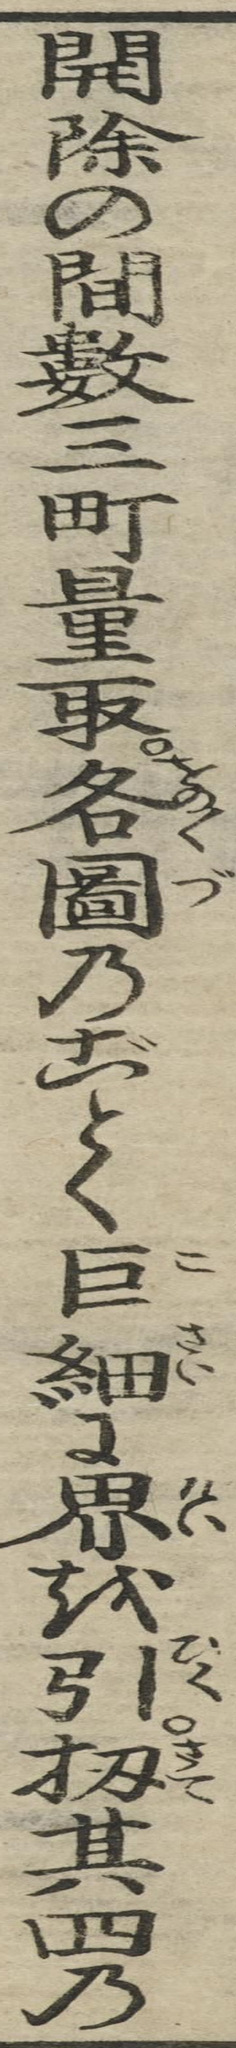開除の間数三町量取。各図のごとく巨細に界を引。扨其四の
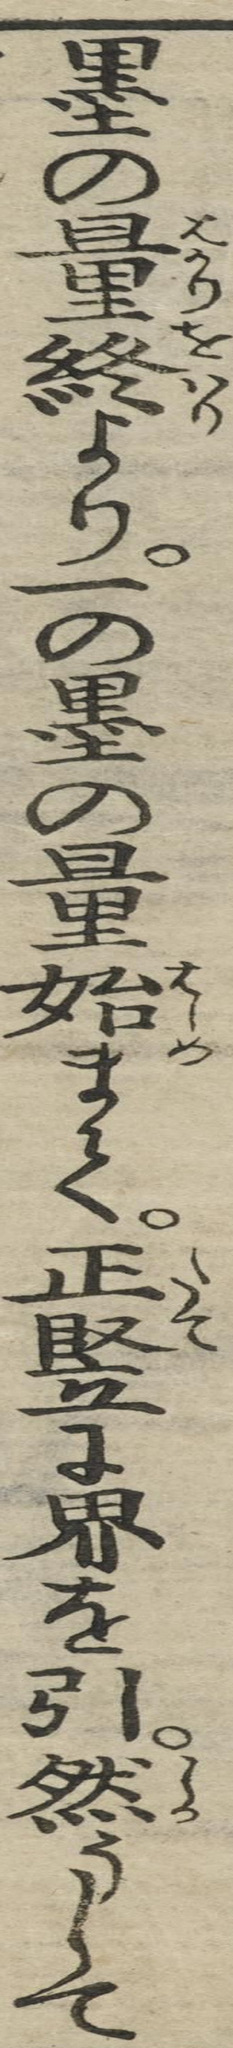墨の量終より。一の墨の量始まて。正竪に界を引。然うして
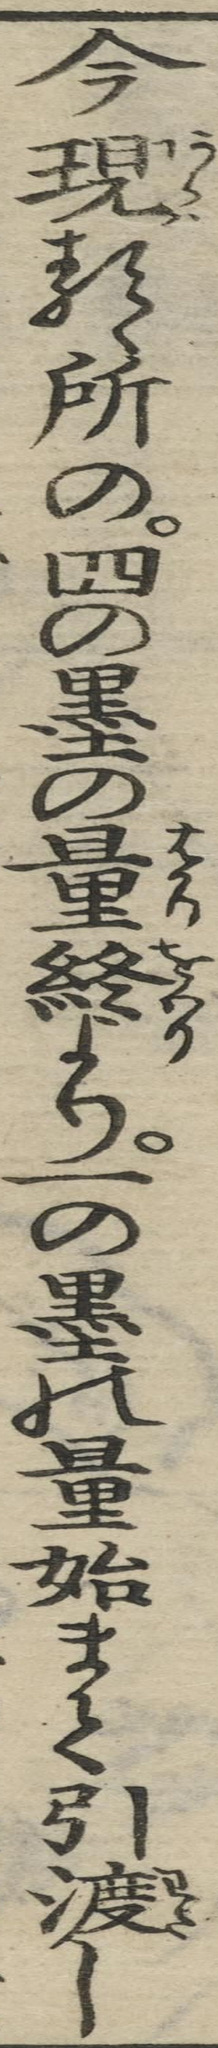今現るゝ所の。四の墨の量終より。一の墨の量始まて引渡し
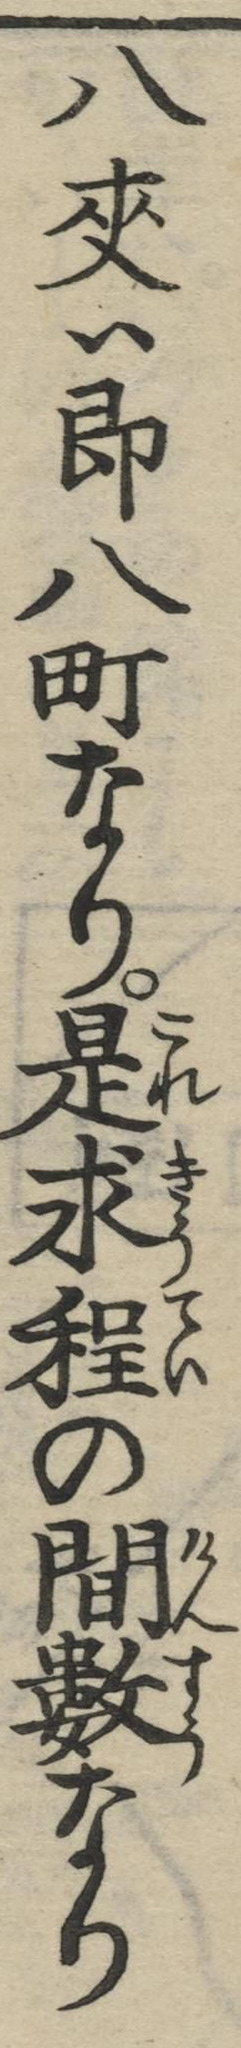八夾は即八町なり。是求程の間数なり
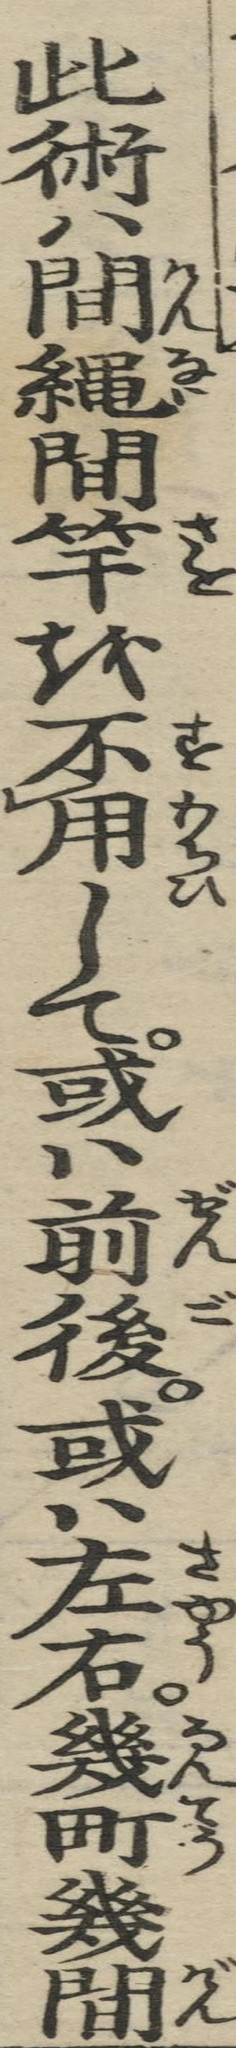この術は間縄間竿を不用して。或は前後。或は左右。幾町幾間
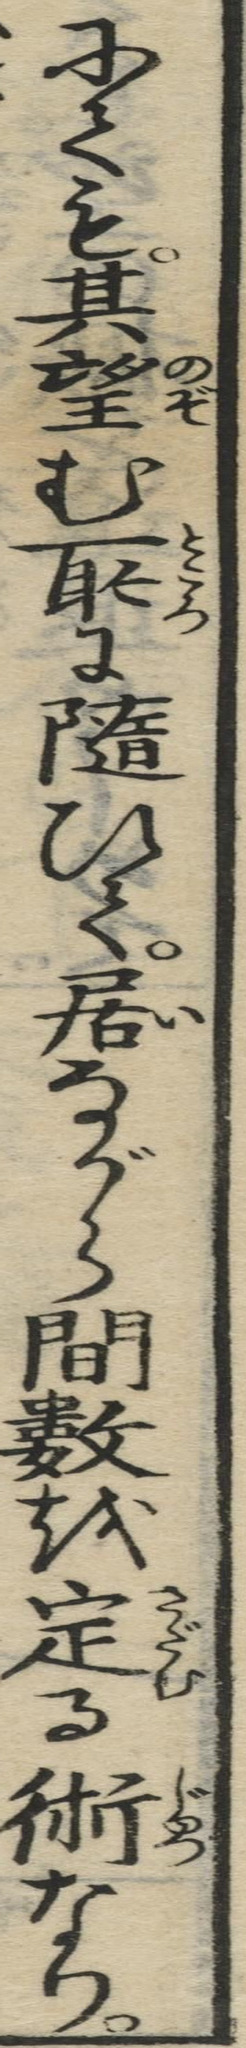にても。其望む所に随ひて。居ながら間数を定る術なり。
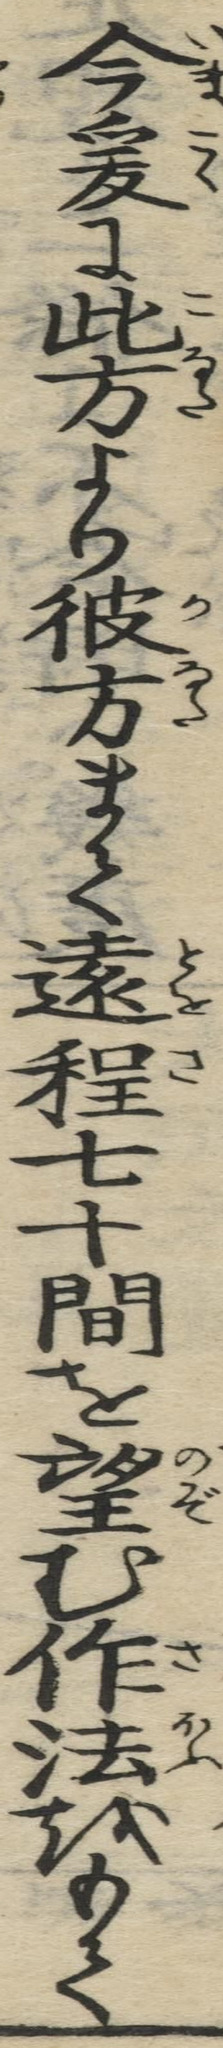今爰に此方より彼方まて遠程七十間を望む作法をもて
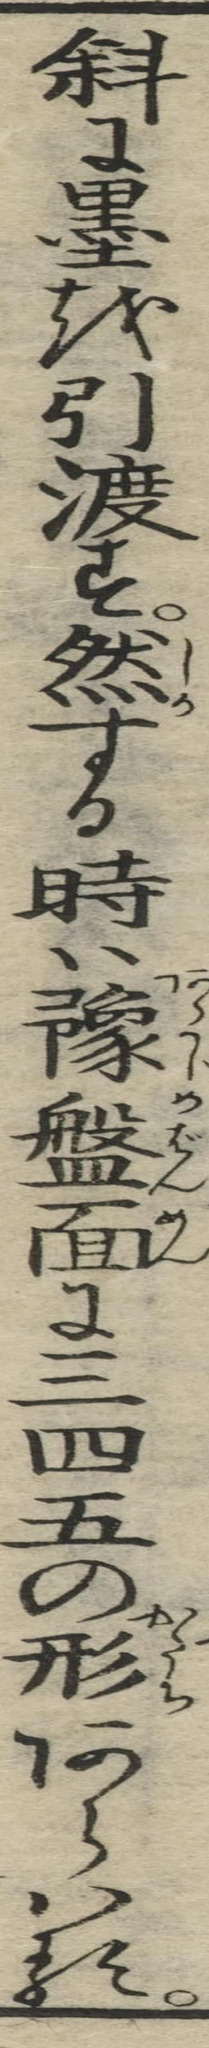斜に墨を引渡す。然する時は予盤面に三四五の形あらはる。

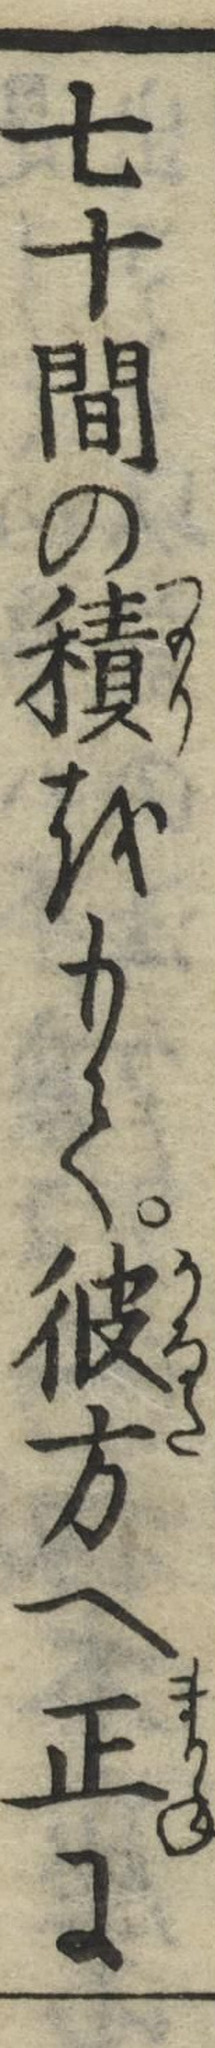七十間の積をもて。彼方へ正に
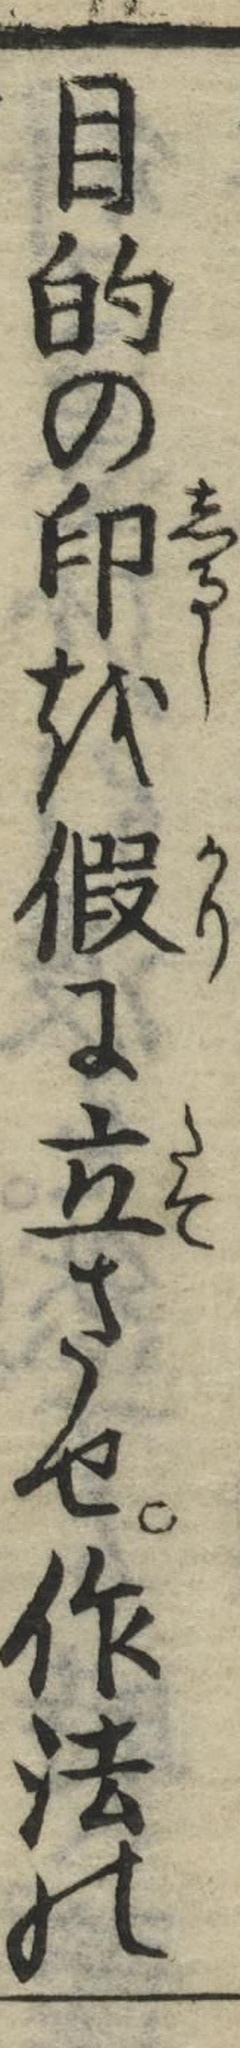目的の印を仮に立させ。作法の
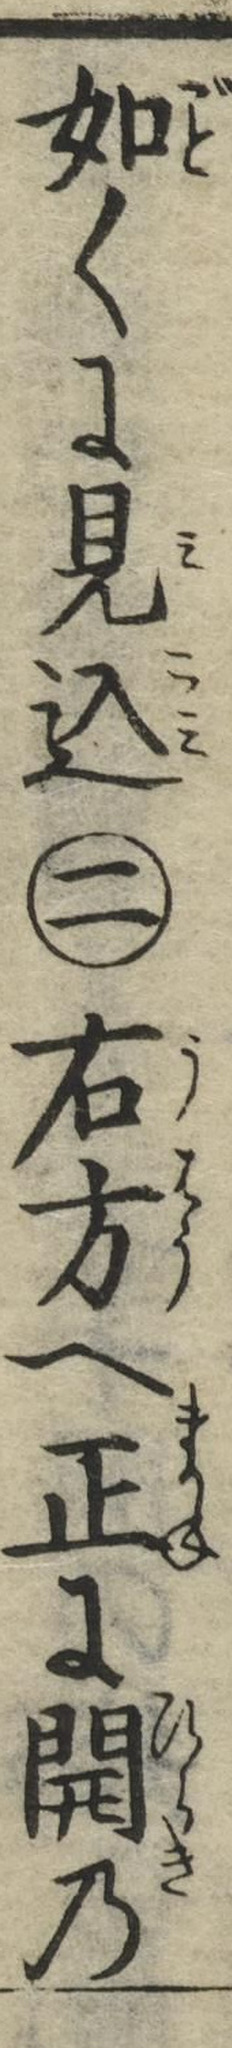如くに見込㊁右方へ正に開の
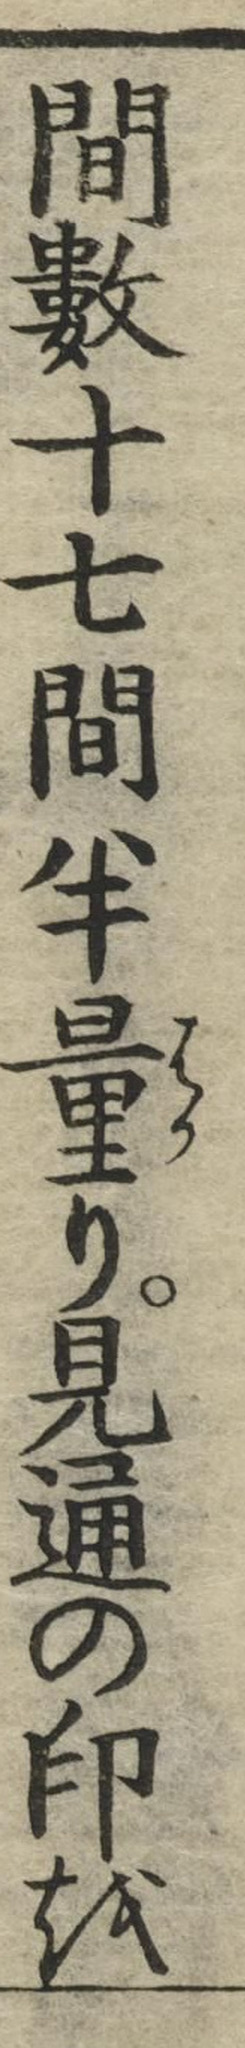間数十七間半量り。見通の印を
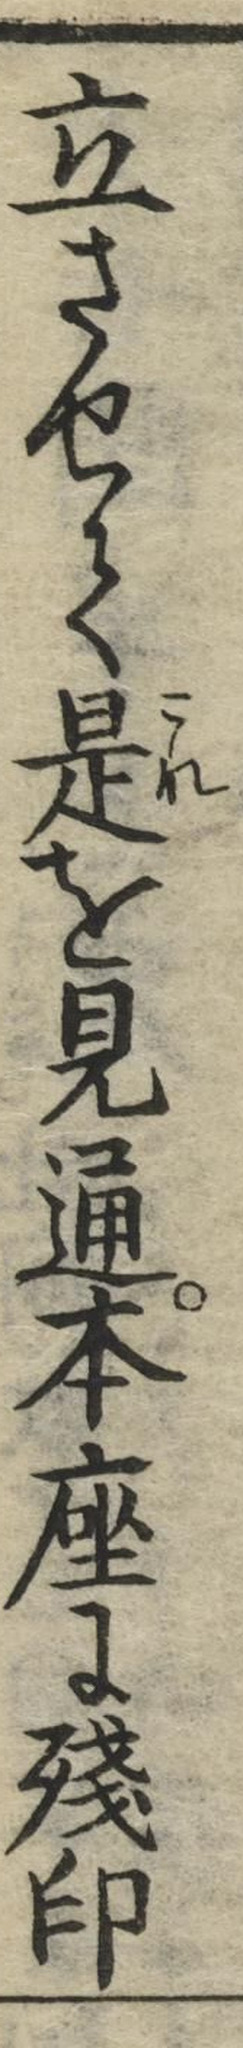立させて是を見通。本座に残印
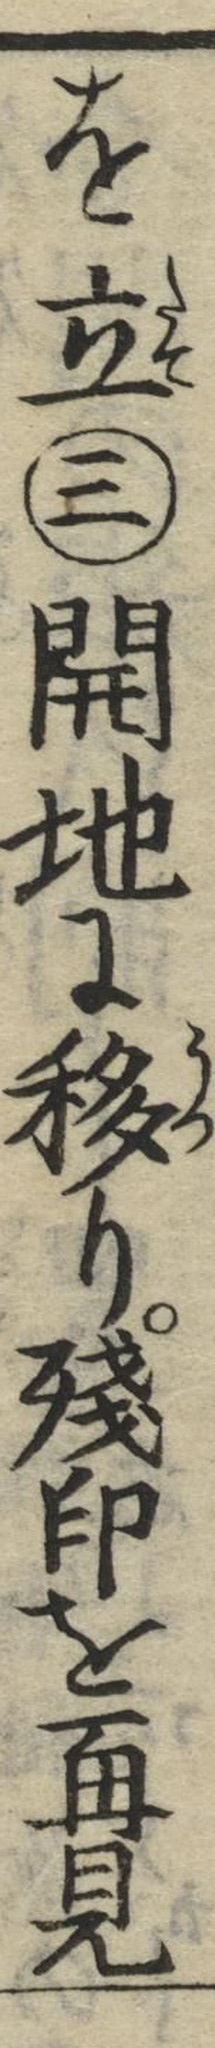を立㊂開地に移り。残印を再見
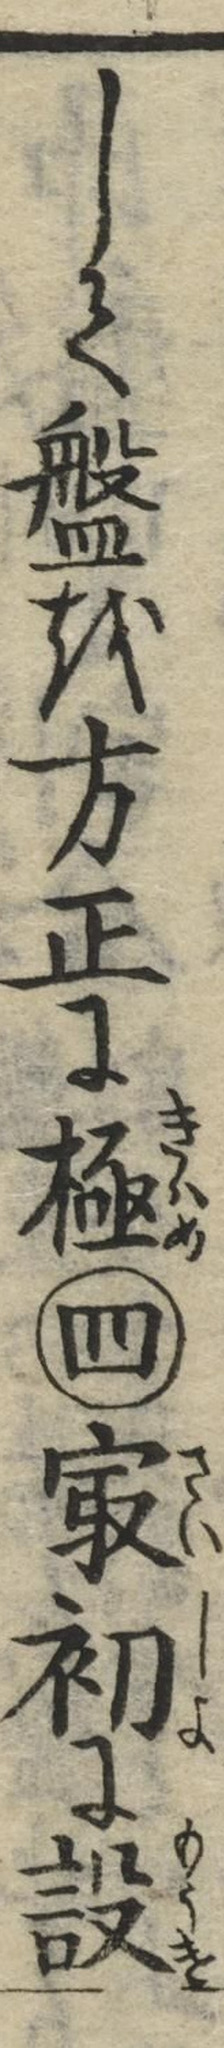して盤を方正に極㊃最初に設
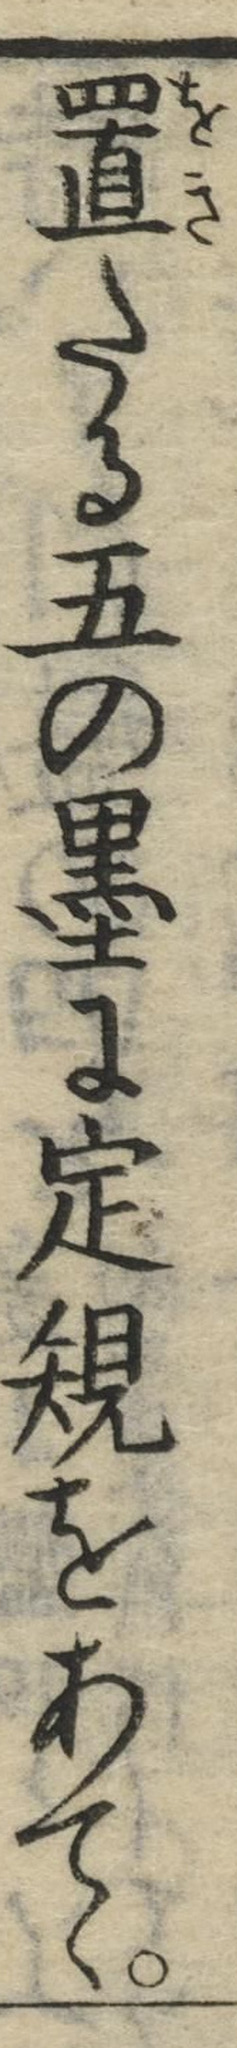置たる五の墨に定規をあてゝ。
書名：量地指南　巻之二（内題）
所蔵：東京大学地震研究所図書室 Earthquake Research Institute Library, The University of Tokyo, JAPAN
